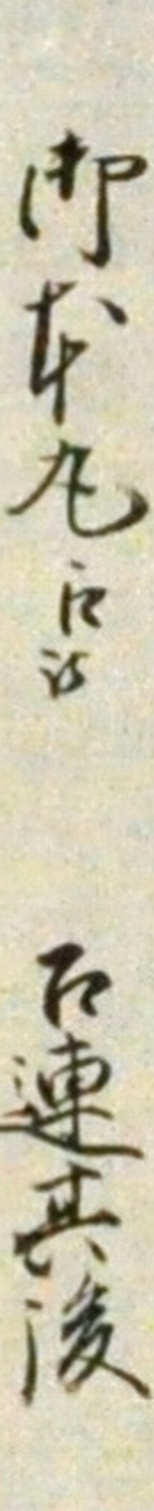御本丸江被召連其後
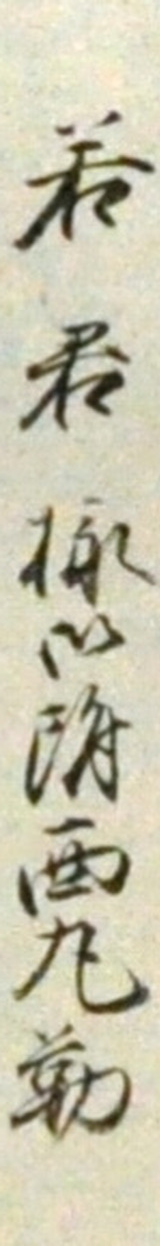若君様御附西丸勤
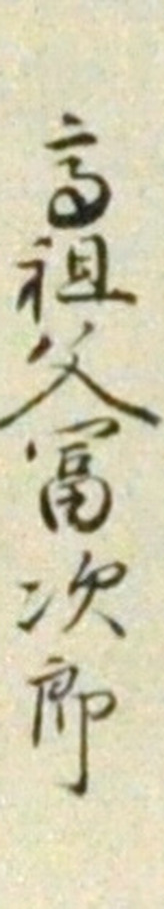高祖父冨次郎
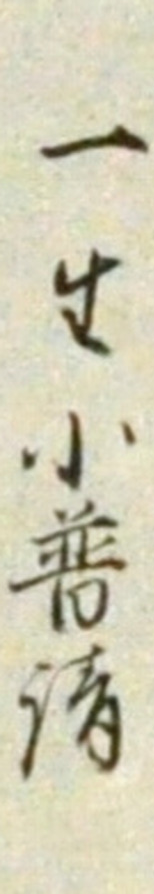一生小普請
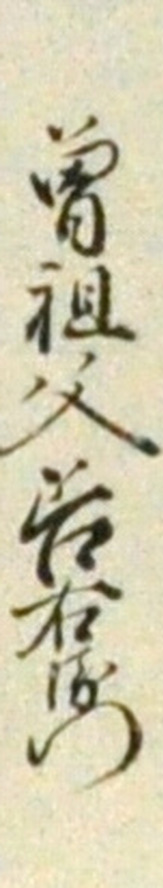曽祖父善右衛門
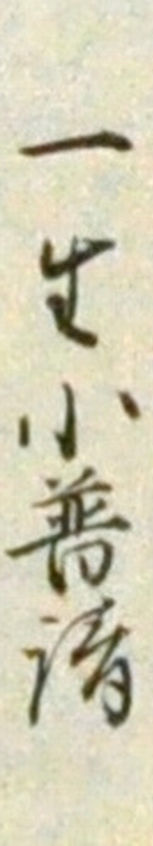一生小普請
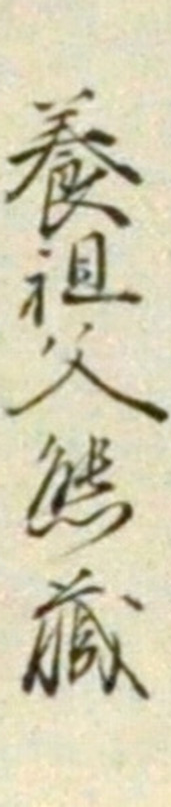養祖父熊蔵
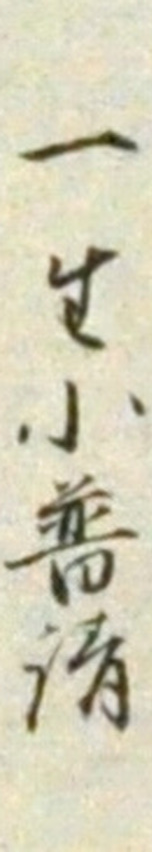一生小普請
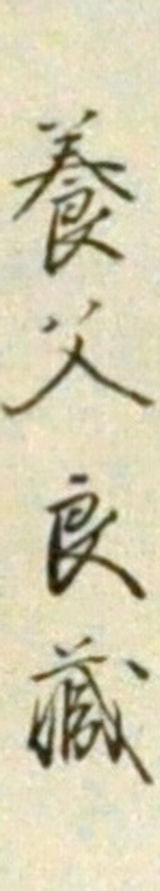養父良蔵
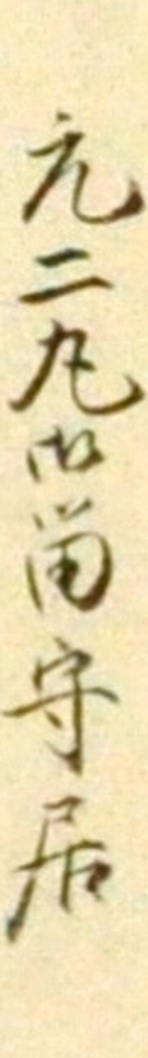元二丸御留守居
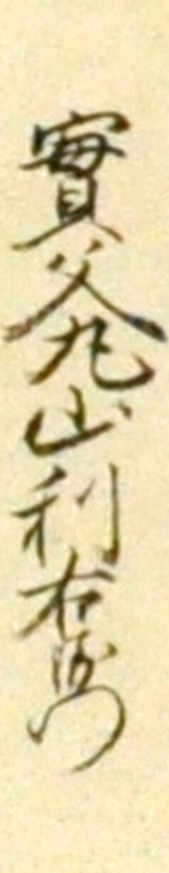實父丸山利右衛門
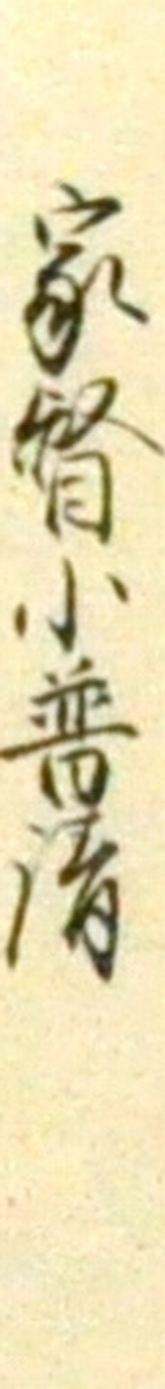家督小普請
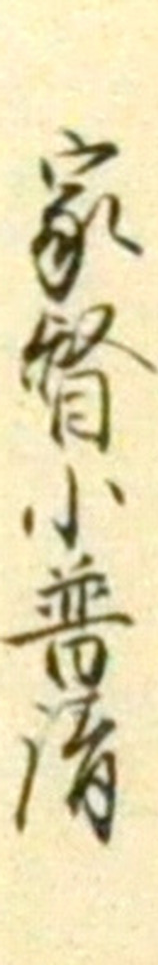家督小普請
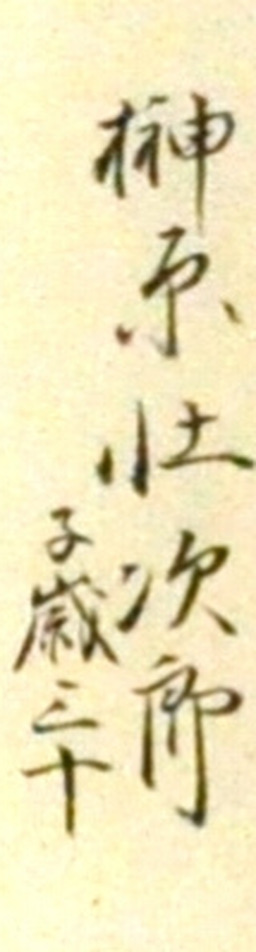子歳三十
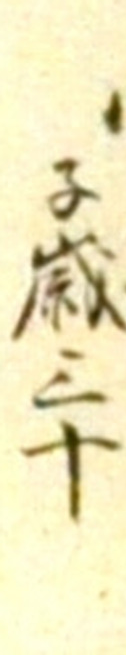子歳三十

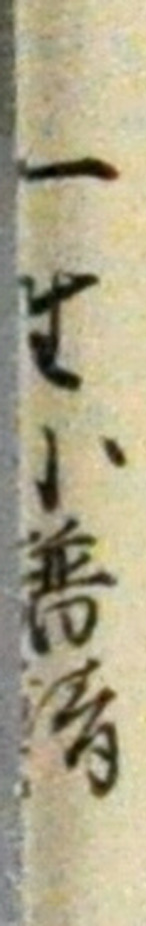一生小普請
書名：若年寄御役中御調書付
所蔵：伊那市立高遠町図書館・合同会社AMANE
